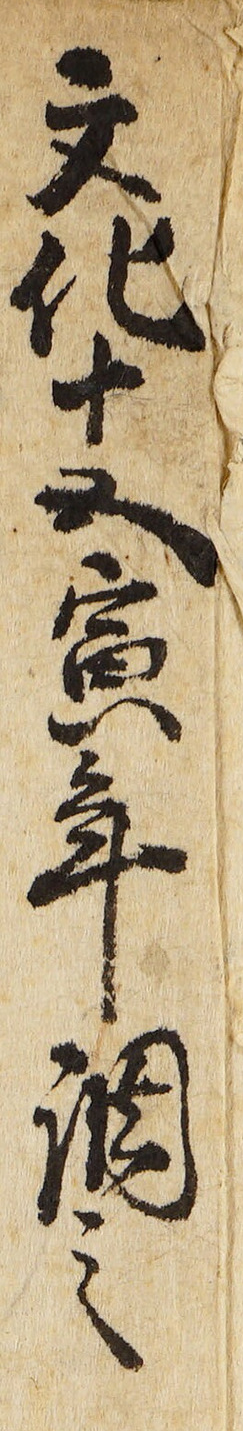文化十五寅年調之
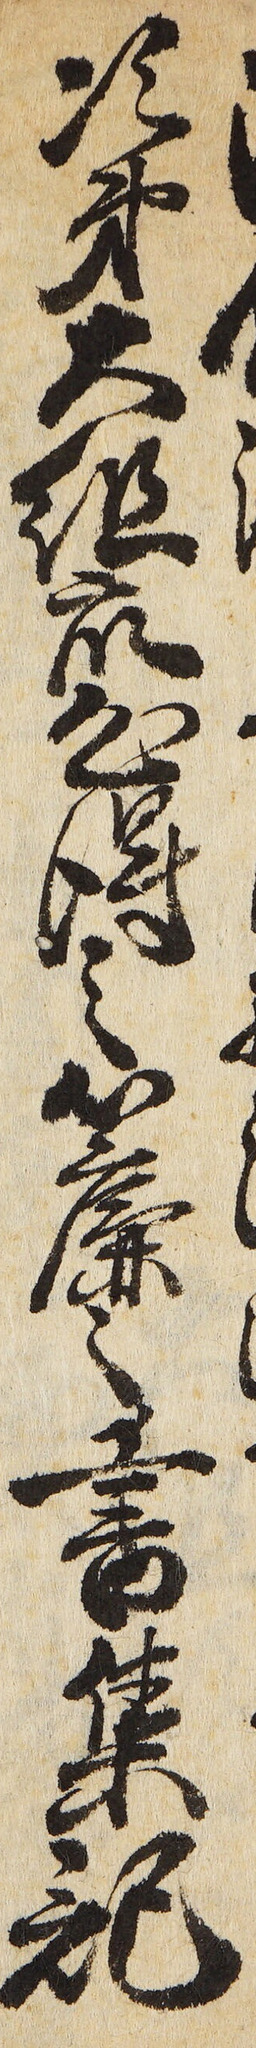次第大組衆心得之御廉々書集記

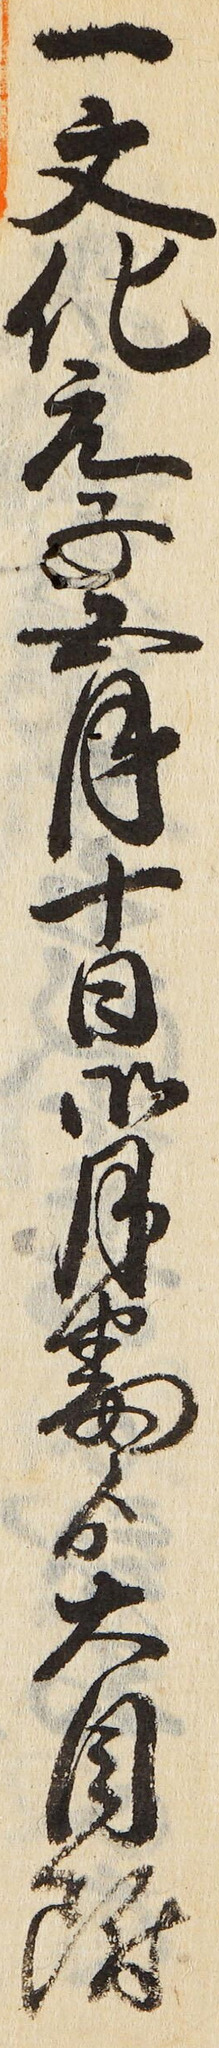一文化元子五月十日御月番ゟ大目付
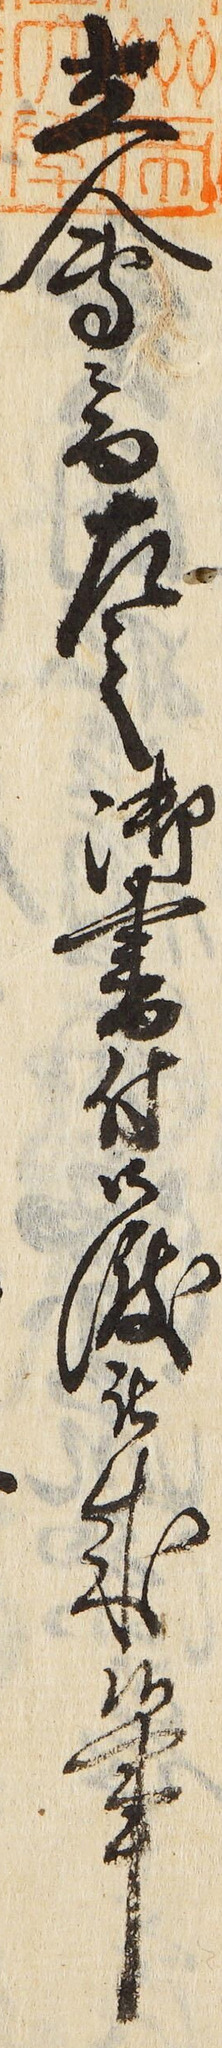立合ニ而左之御書付御渡被成候事
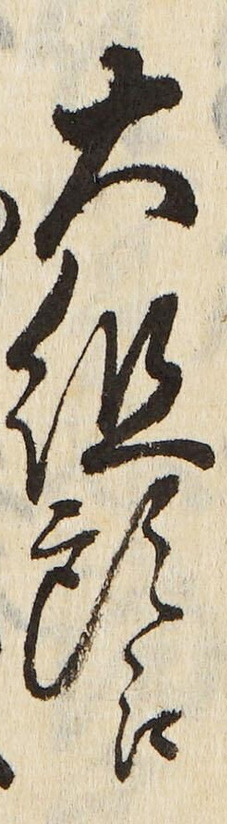大組頭江
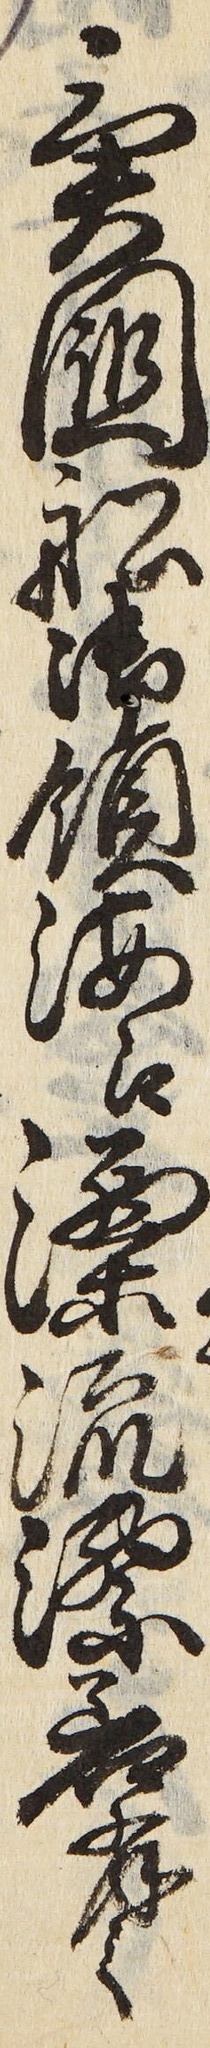異国船御領海江漂流漂着有之
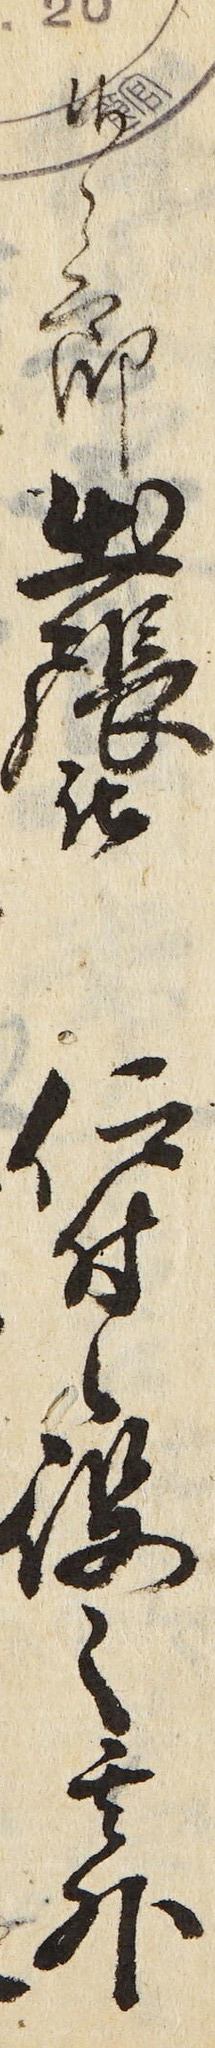候之節出張被仰付候役々其外
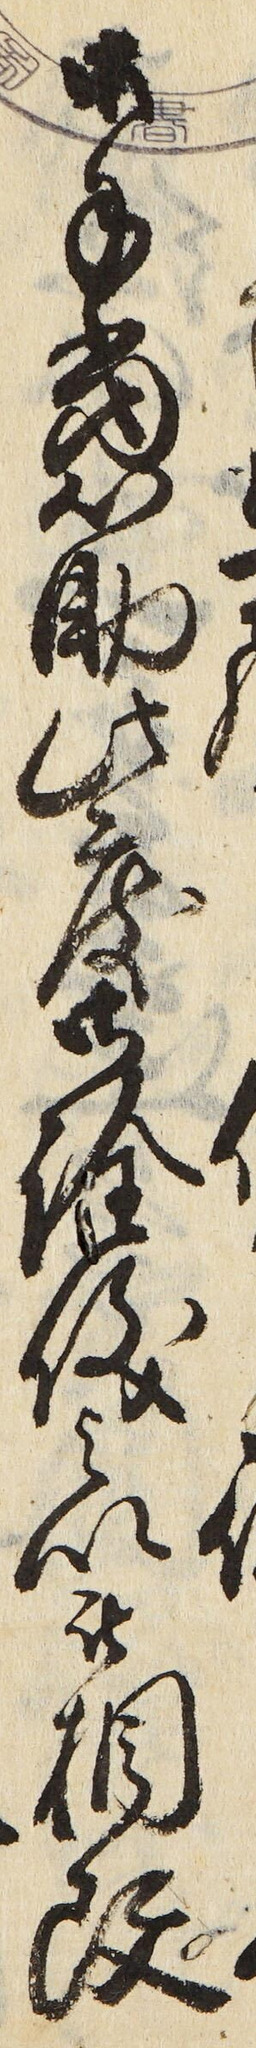御手当筋此度御詮儀与以被相改
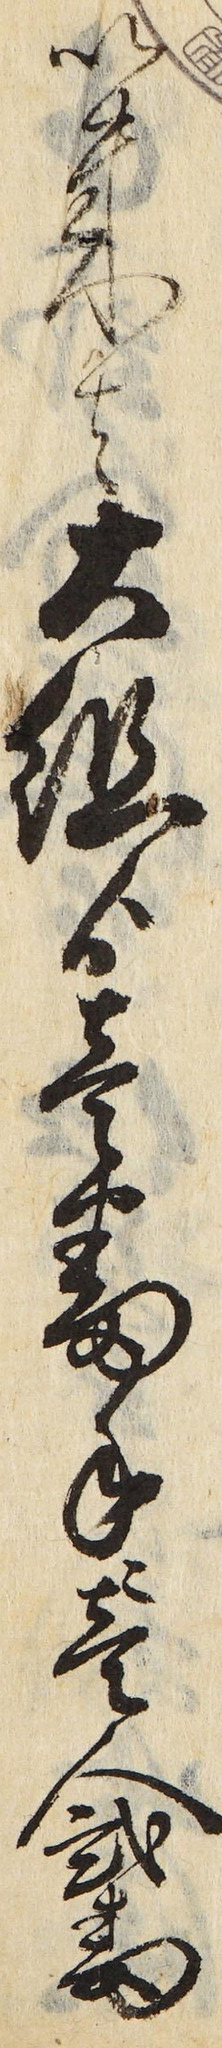以来者大組ゟ壱番手ニ壱人弐番

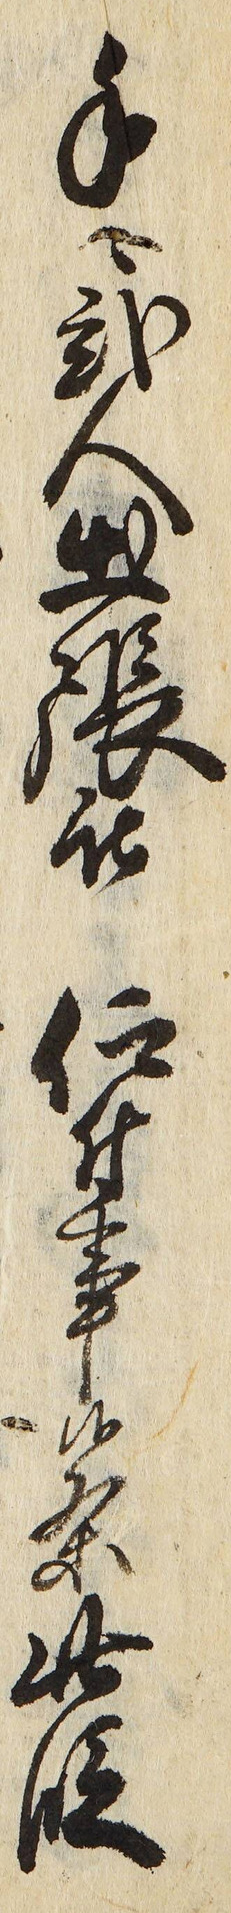手ニ弐人出張被仰付事候条此段
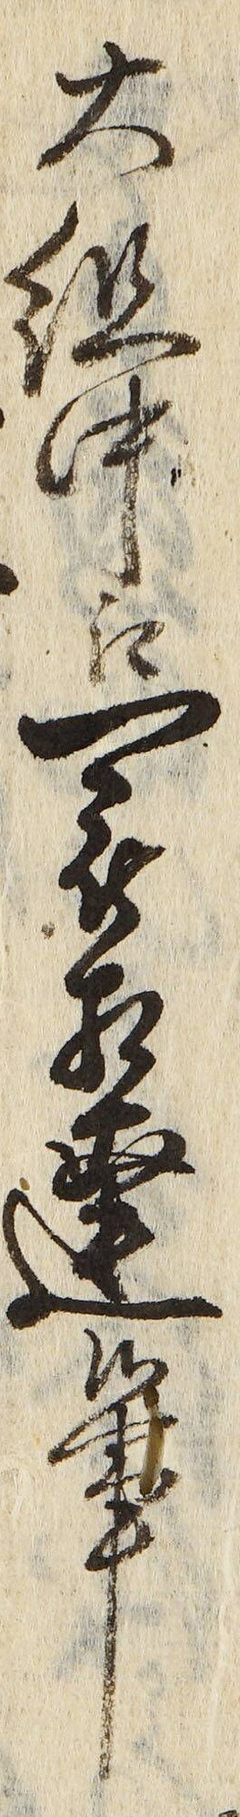大組中江可被相達候事
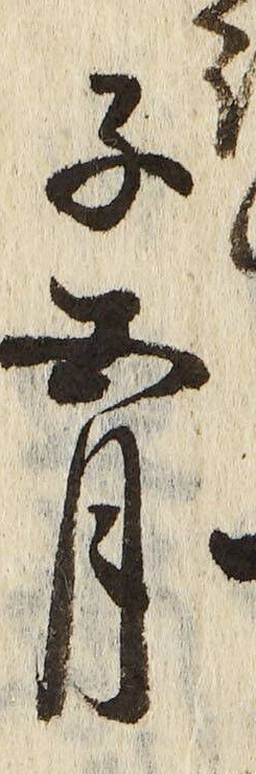子五月
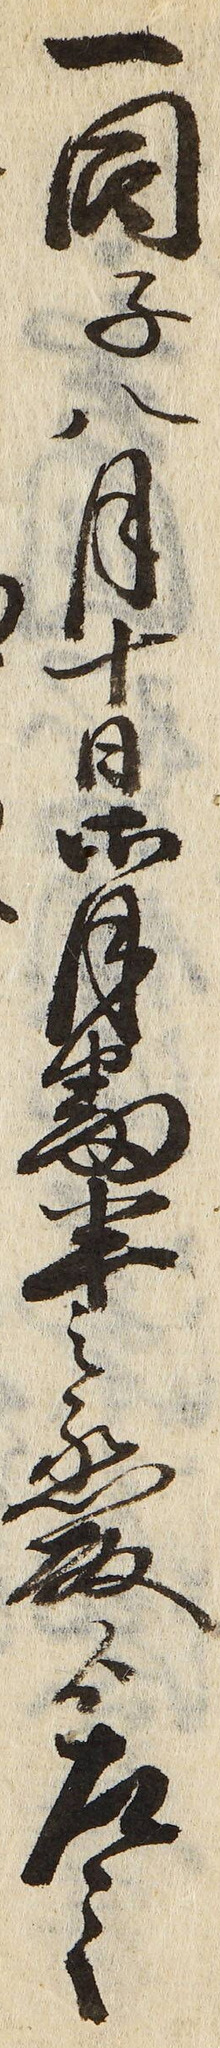一同子八月十日御月番半之丞殿ゟ左之
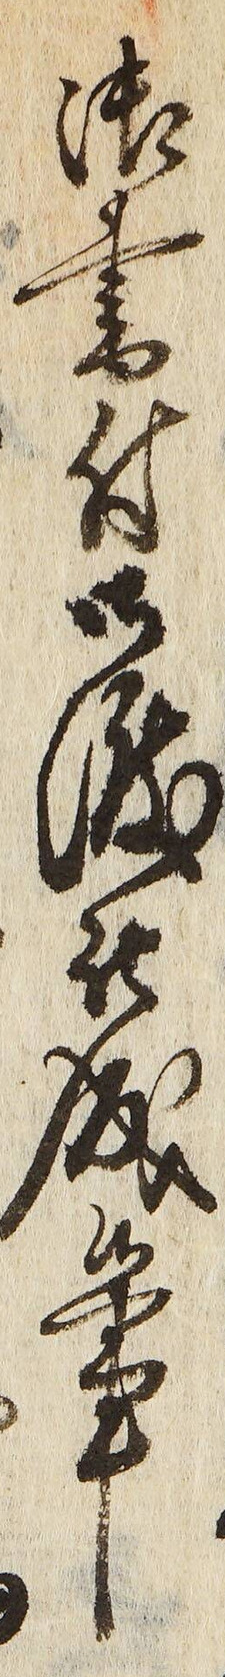御書付御渡被成候事
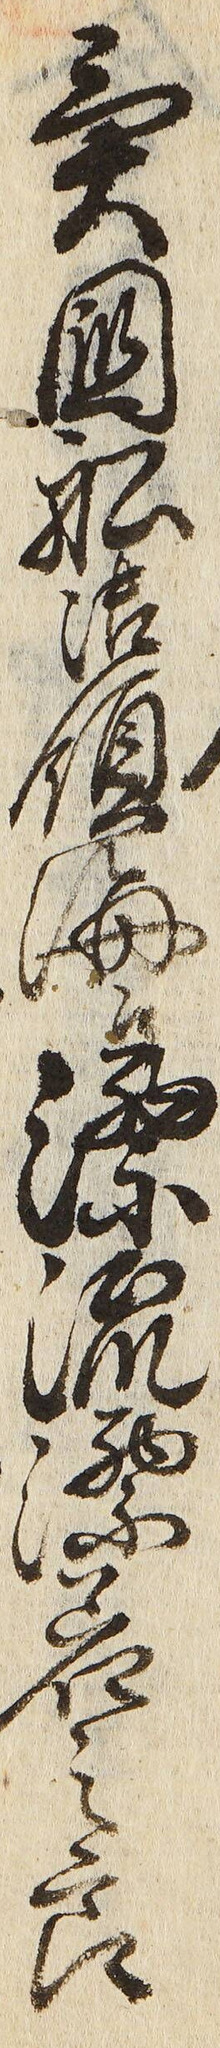異国船御領海江漂流漂着之節
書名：御領海江異国船漂流有之節御手当之次第大組頭心得之廉々書集記
